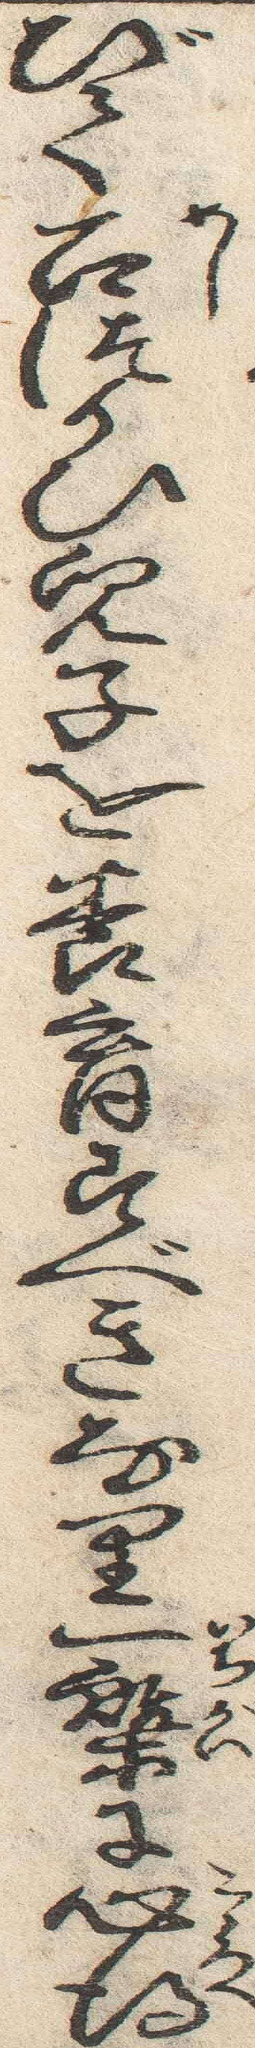びて召つかひ児子を養育すべきなり一槩に心得
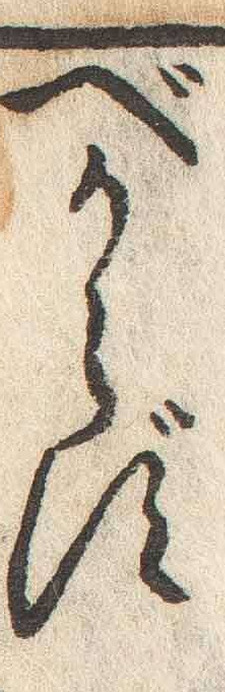べからず
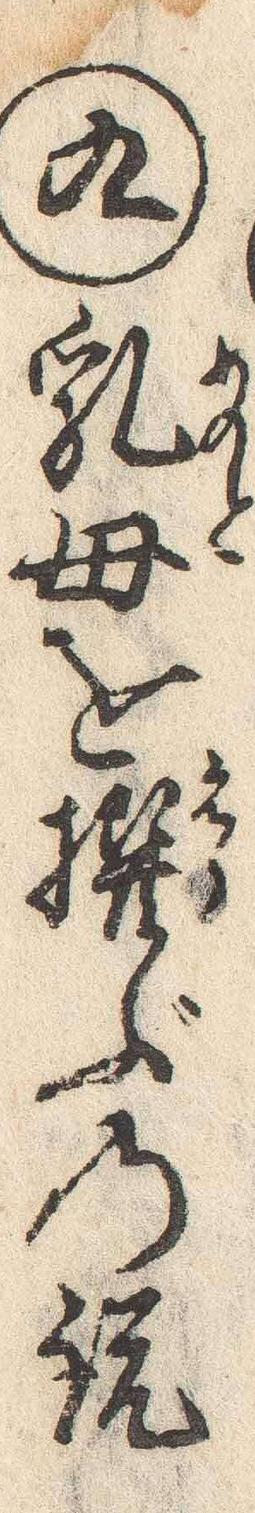㊈乳母を撰ぶの説
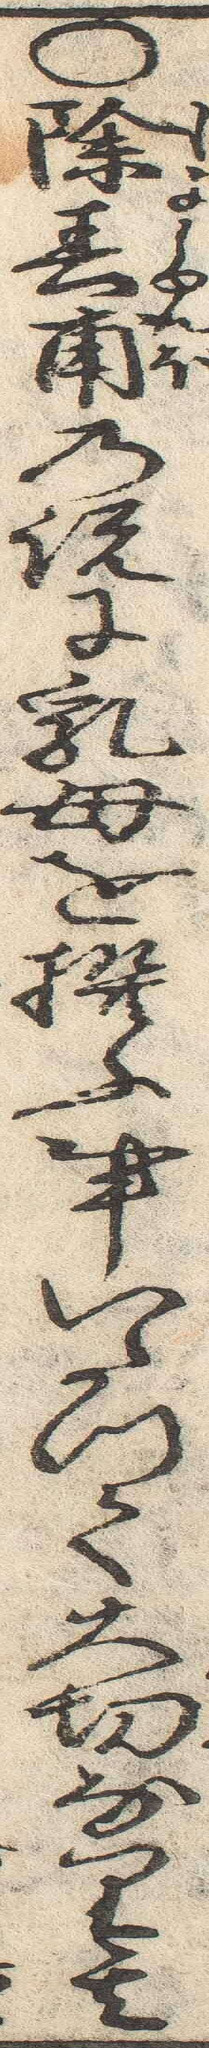◯除春甫の説に乳母を撰ふ事いたつて大切なり其
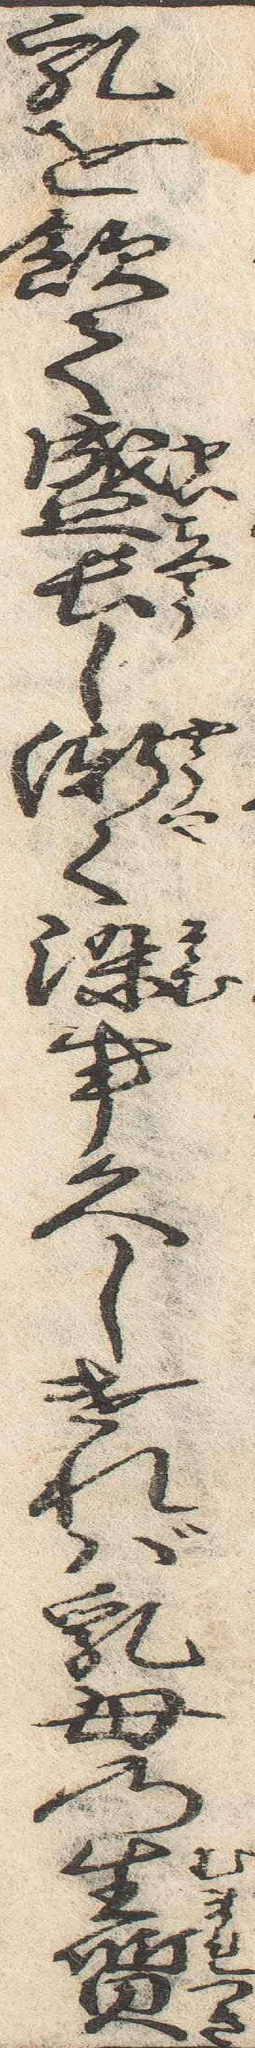乳を飲て盛長し漸く染事久しければ乳母の生質
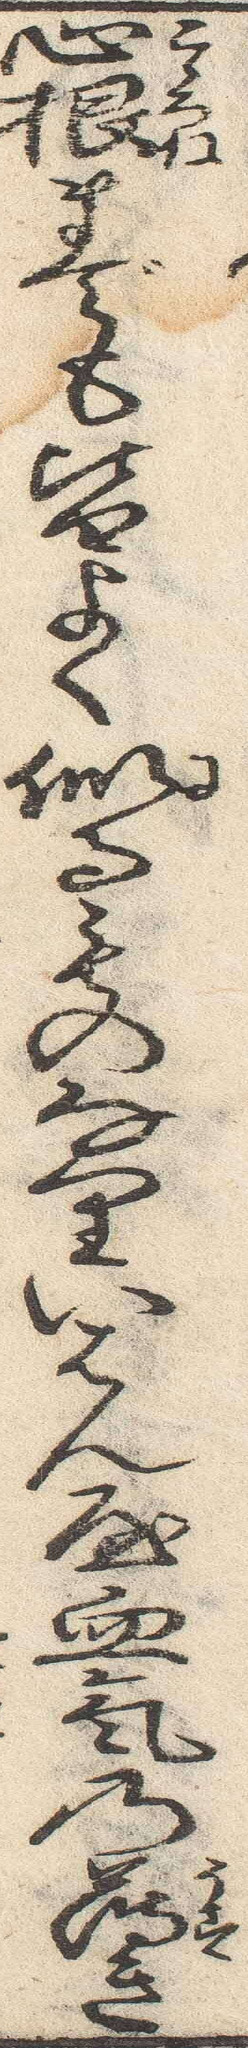心根までも皆よく似るものなりいはんや血気の薄き
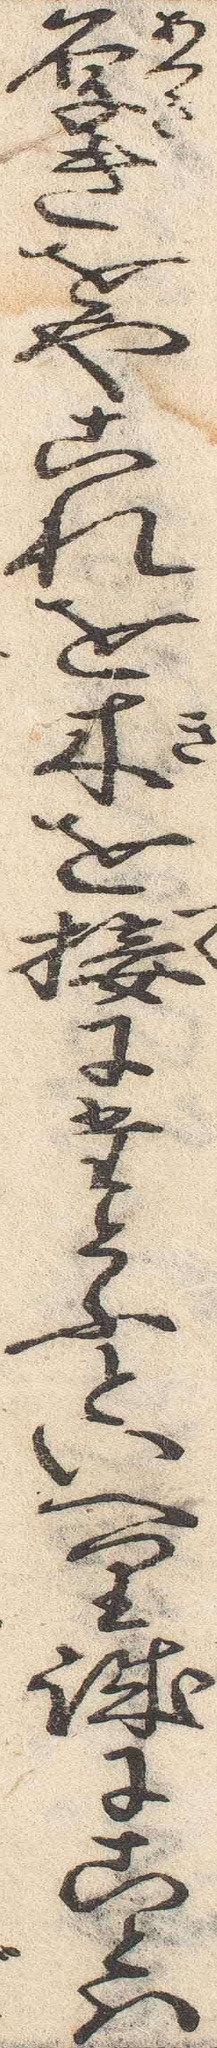厚きをやこれを木を接にたとふといへり誠にことは
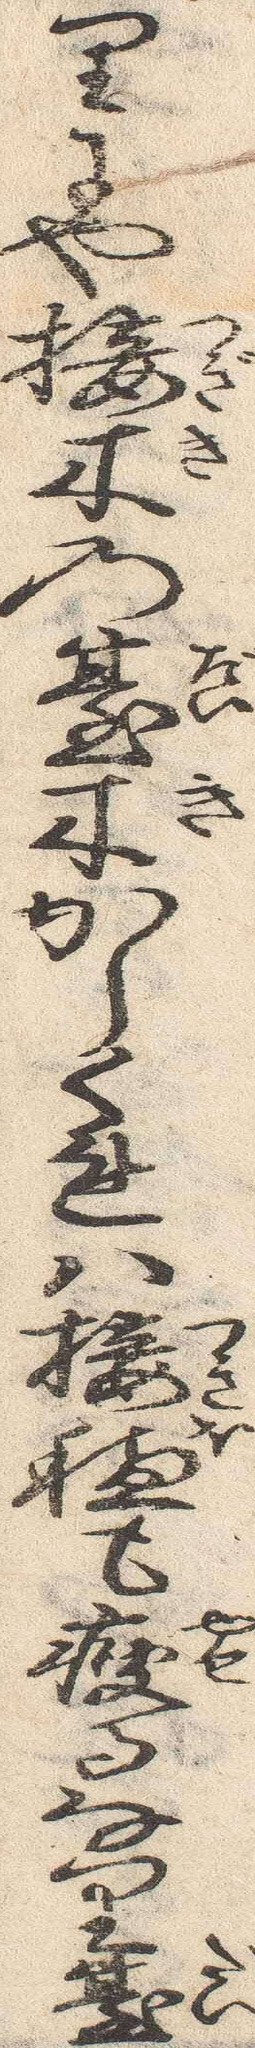りにや接木の䑓木かしくれは接穂も痩るなり䑓
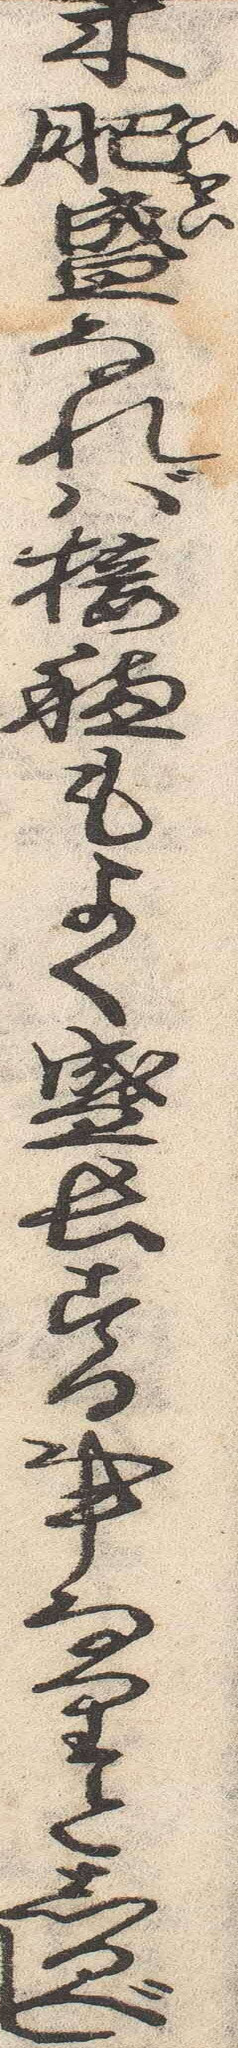木肥盛なれば接穂もよく盛長する事なりとしるべし
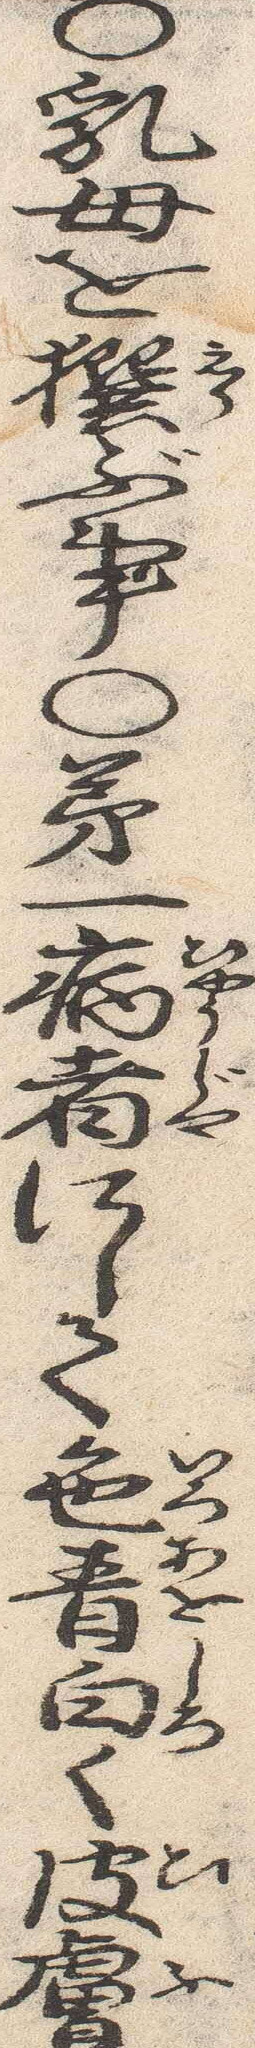◯乳母を撰ぶ事◯第一病者にして色青白く皮膚
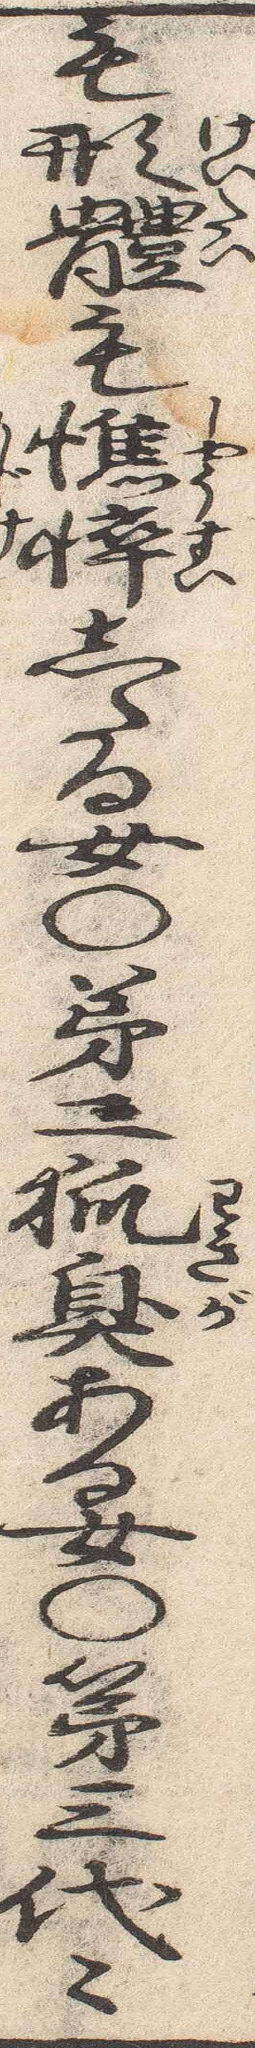も形體も憔悴したる女◯第二狐臭ある女◯第三代々
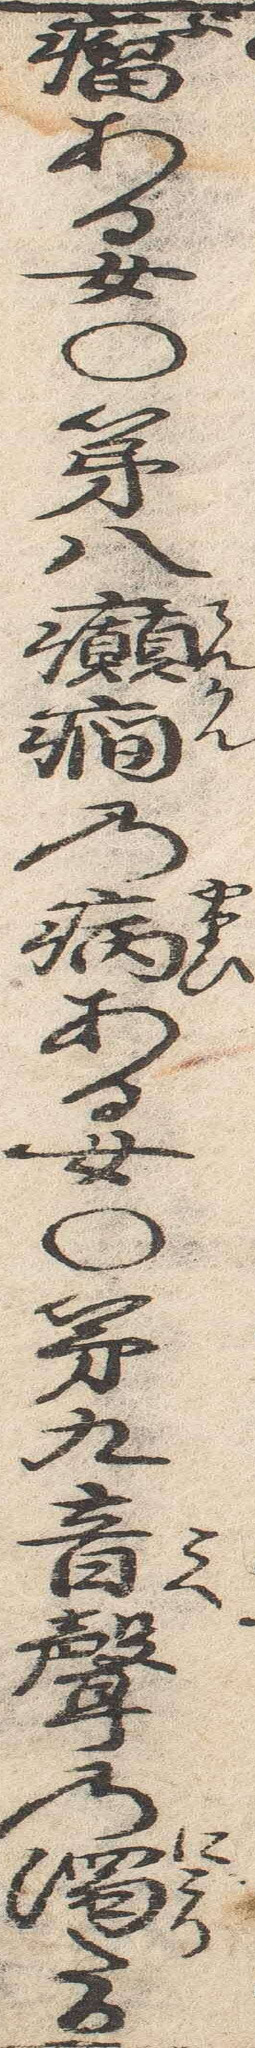瘤ある女◯第八癲癇の病ある女◯第九音聲の濁たる
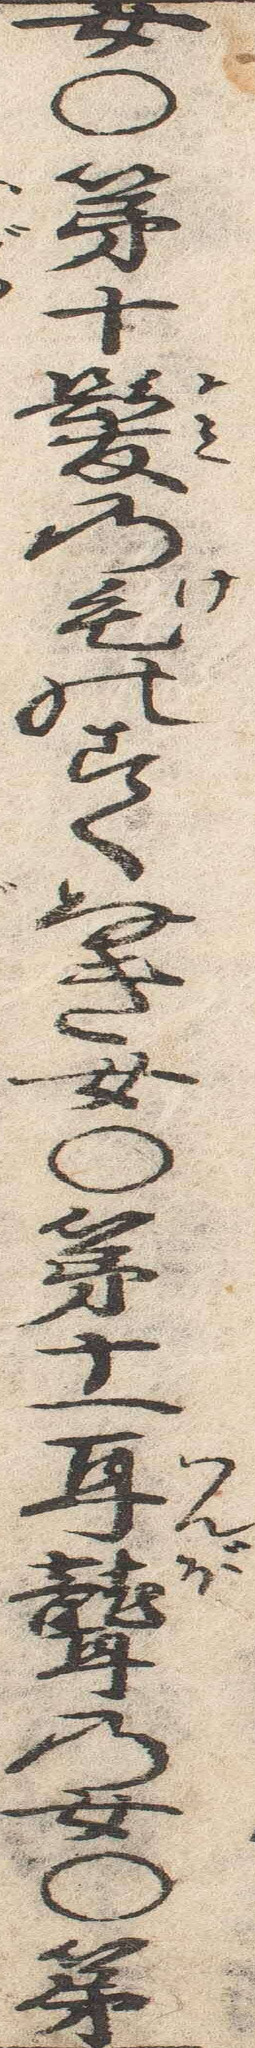女◯第十髪の毛のすくなき女◯第十一耳聾の女◯第
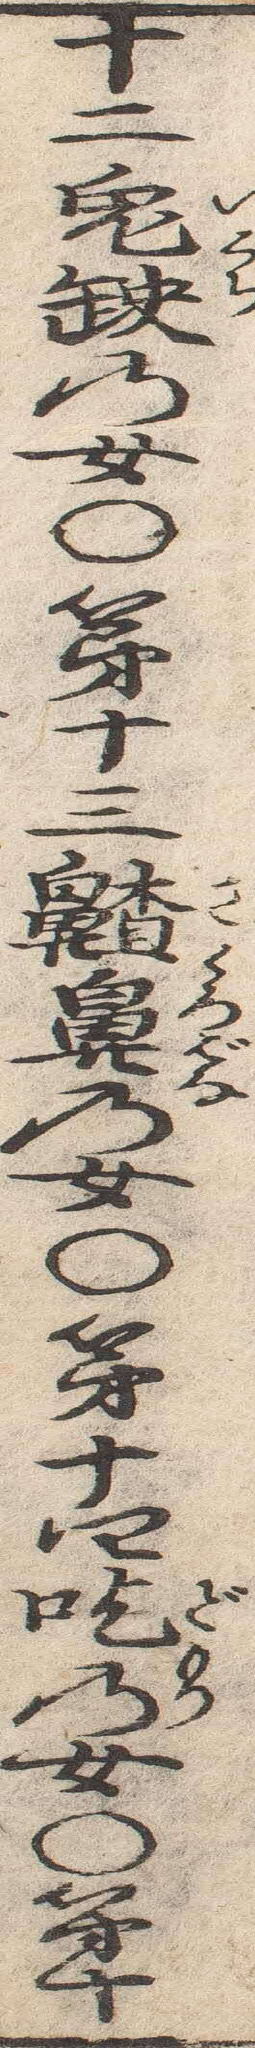十二兎缺の女◯第十三齄鼻の女◯第十四吃の女◯第十
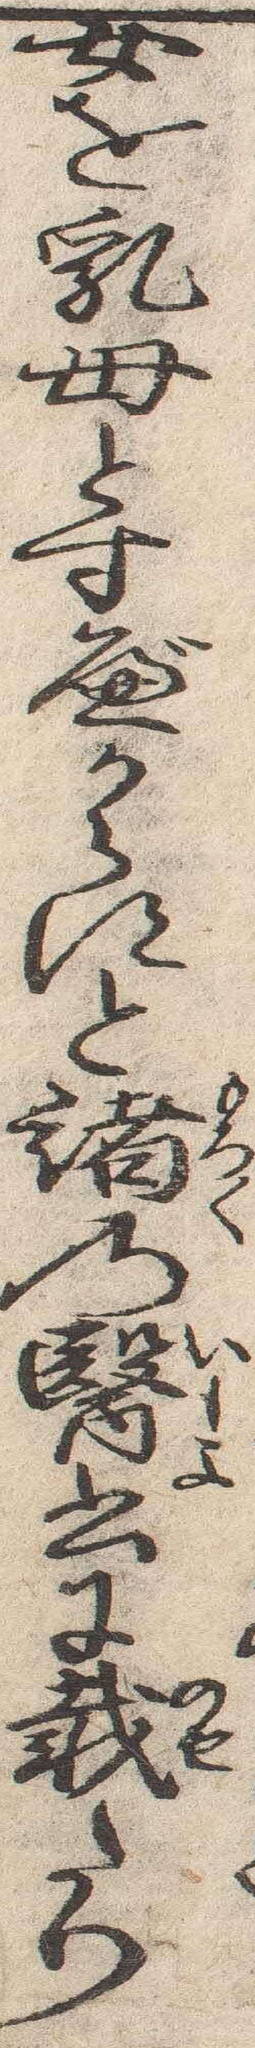女を乳母とすべからすと諸の醫書に載たり
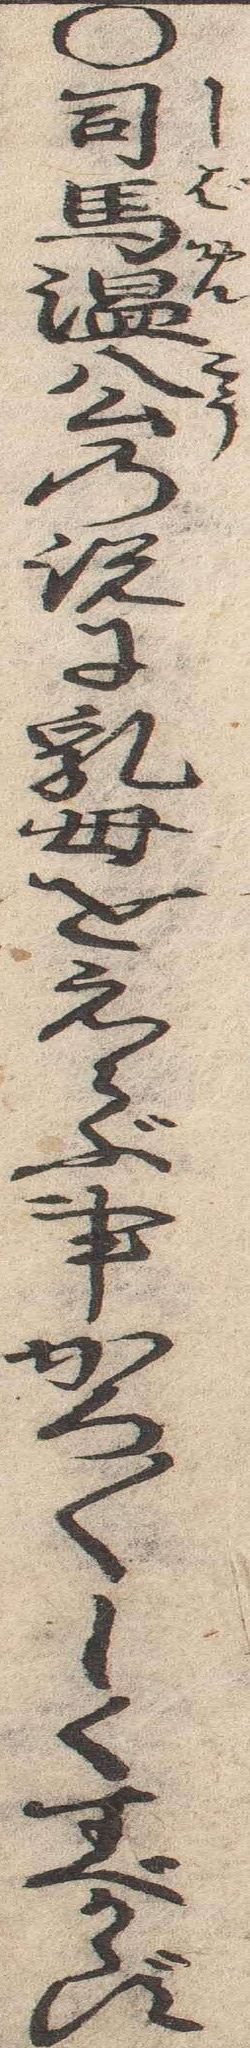◯司馬温公の説に乳母をえらぶ事かろ〳〵しくすべからず
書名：小児必用養育草
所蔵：東京学芸大学附属図書館 国文学研究資料館
